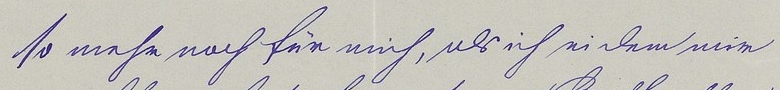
so mehr noch für mich, als ich in dem mir
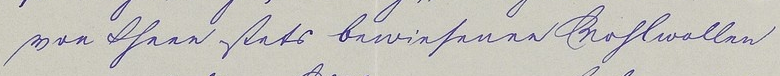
von Ihnen stets bewiesenen Wohlwollen
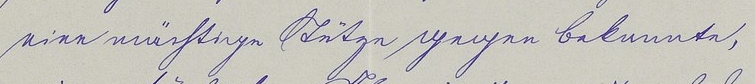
eine mächtige Stütze gegen bekannte,
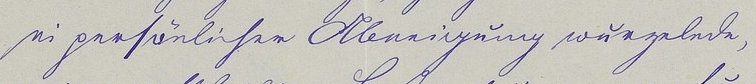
in persönlicher Abneigung wurzelnde,
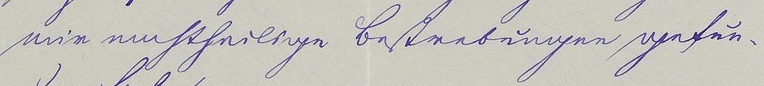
mir nachtheiligen Bestrebungen gefun-
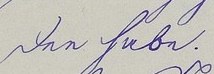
den habe.
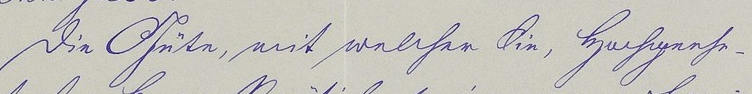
Die Güte, mit welcher Sie, hochgeehr-
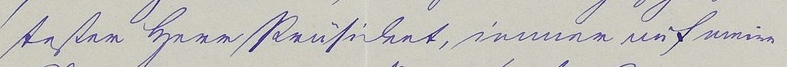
tester Herr Präsident, immer auf meine
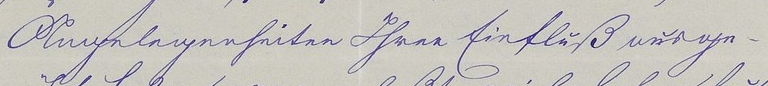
Angelegenheiten Ihren Einfluß ausge-
